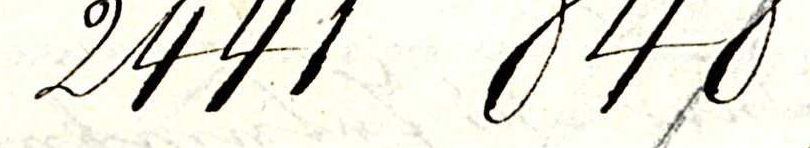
2441 [1]848
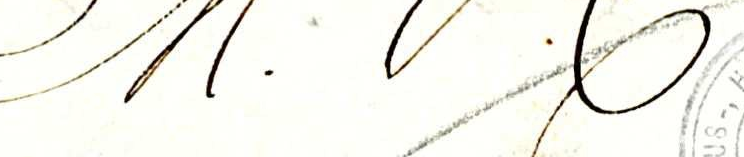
MR
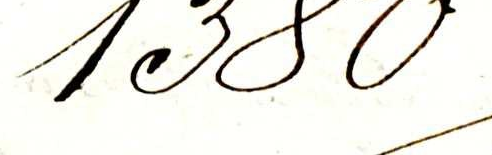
1380
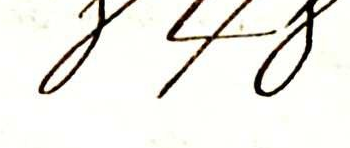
848
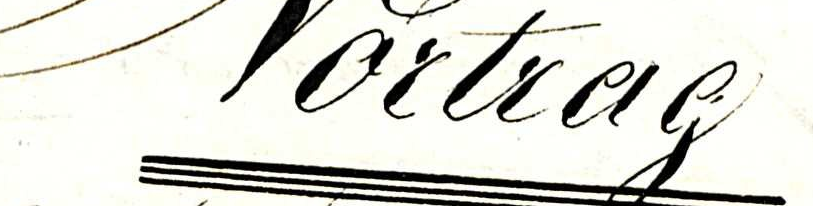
Vortrag
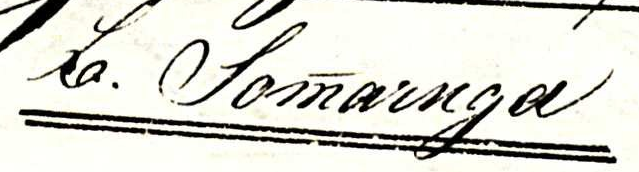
B. Sommaruga
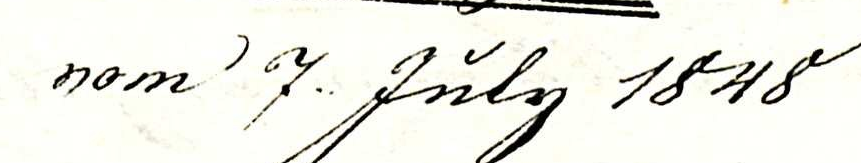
vom 7. July 1848
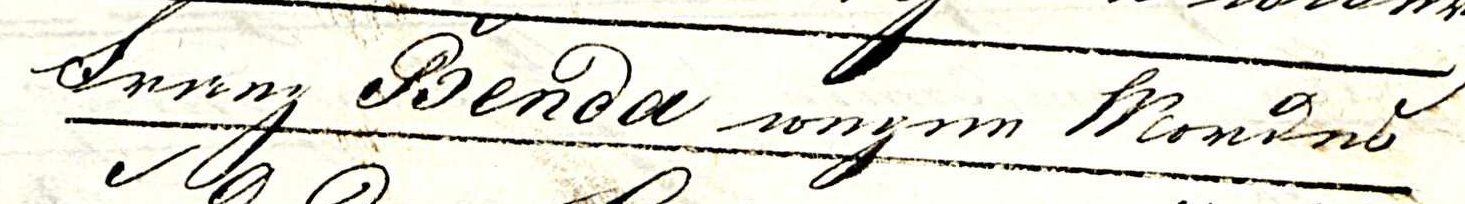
Franz Benda wegen Mordes
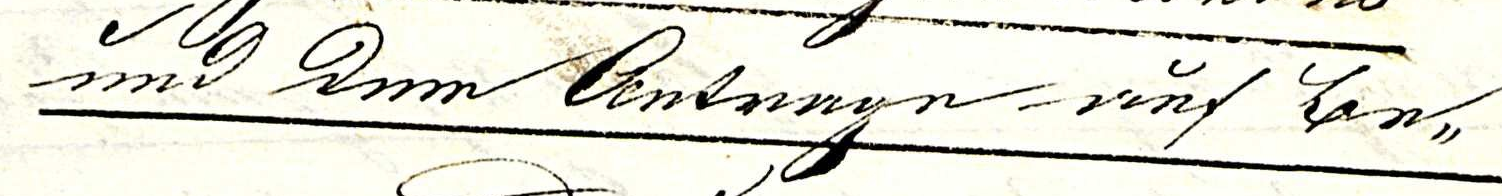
und dem Antrage auf Be¬
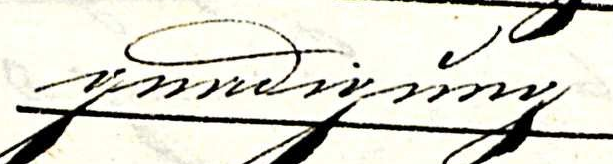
gnadigung
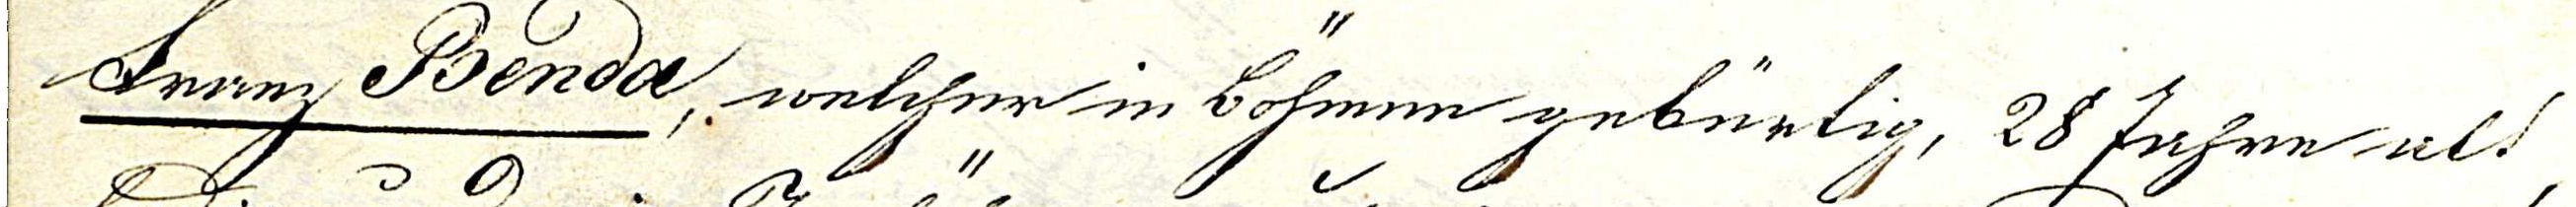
Franz Benda, welcher in Böhmen gebürtig, 28 Jahre alt,
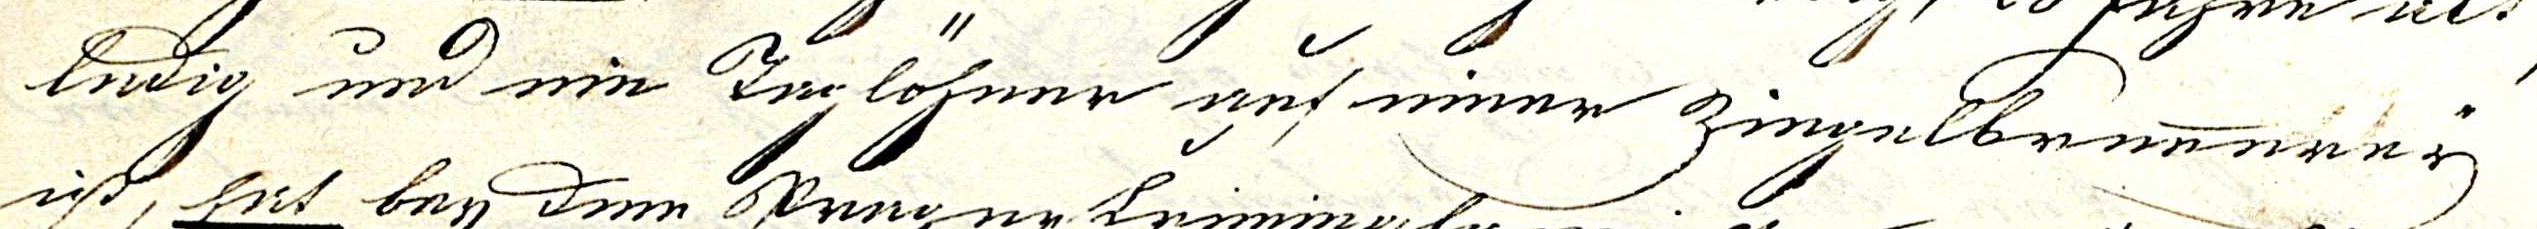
ledig, und ein Taglöhner auf einer Ziegelbrennerey
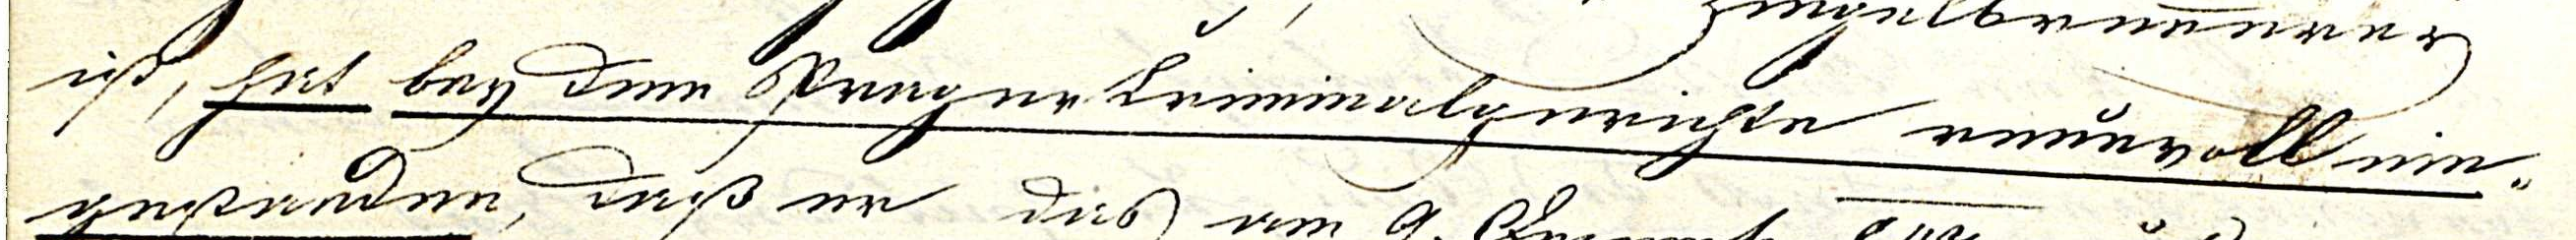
ist, hat bey dem Prager Criminalgerichte reuevoll ein¬
